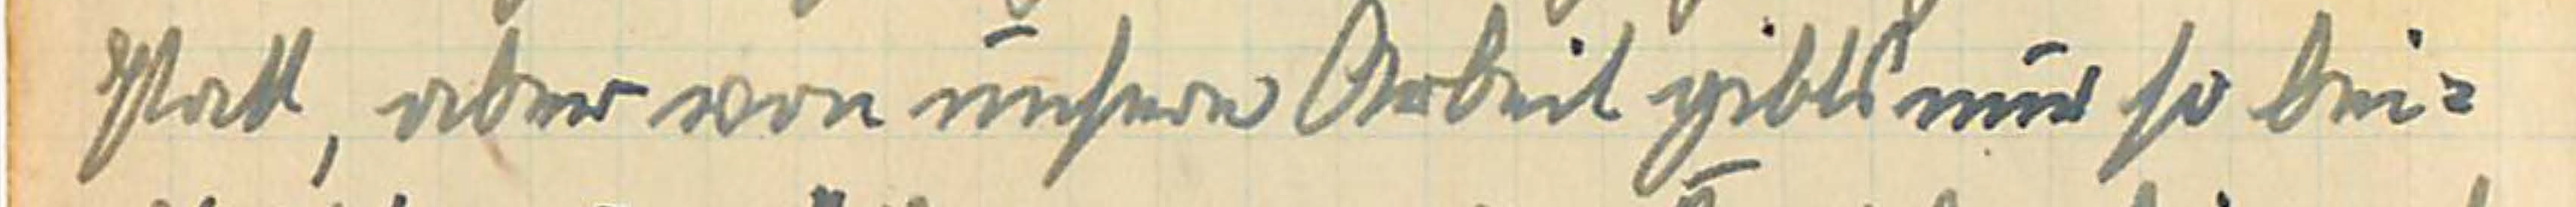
Pak, aber von unserer Arbeit gibts nur so bei-
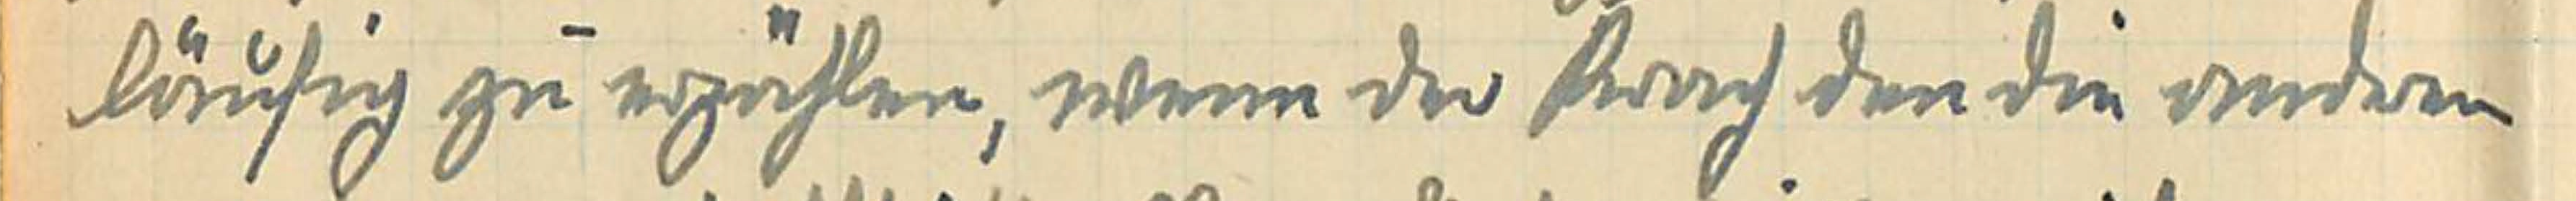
läufig zu erzählen, wenn der Krach den die anderen
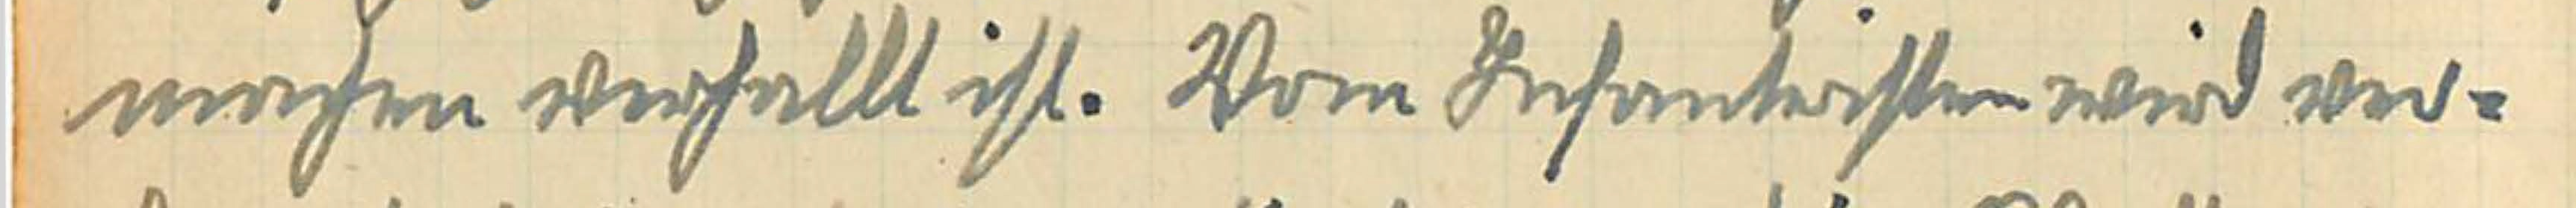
machen verhallt ist. Vom Infanteristen wird ver-
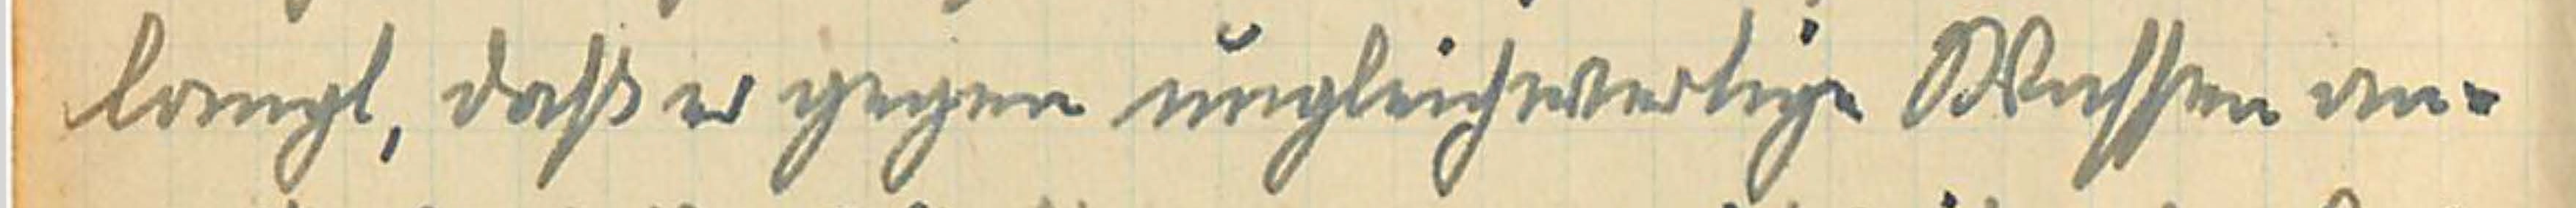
langt, daß er gegen ungleichwertige Waffen an-
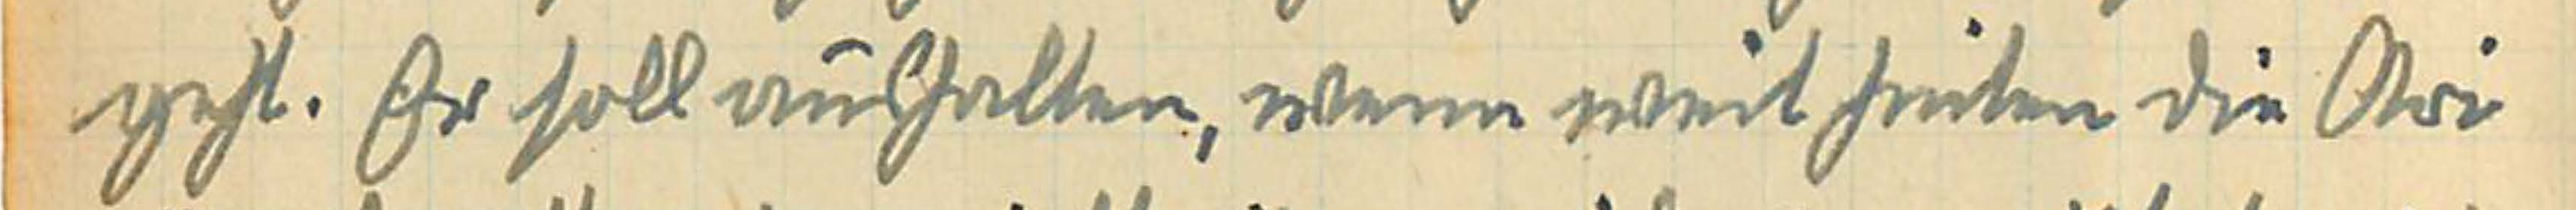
geht. Er soll aushalten, wenn weit hinten die Ari
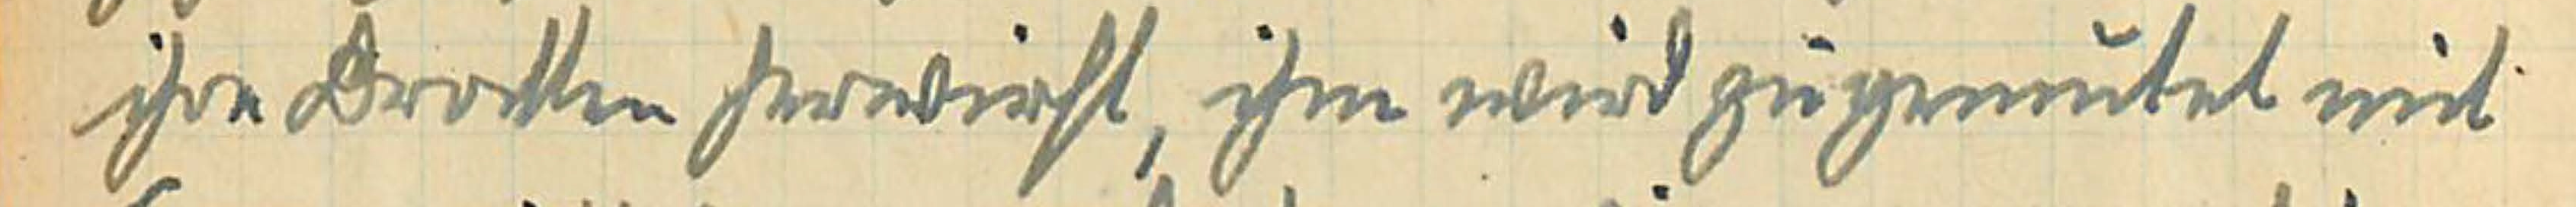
ihre Brocken herwirft, ihm wird zugemutet mit
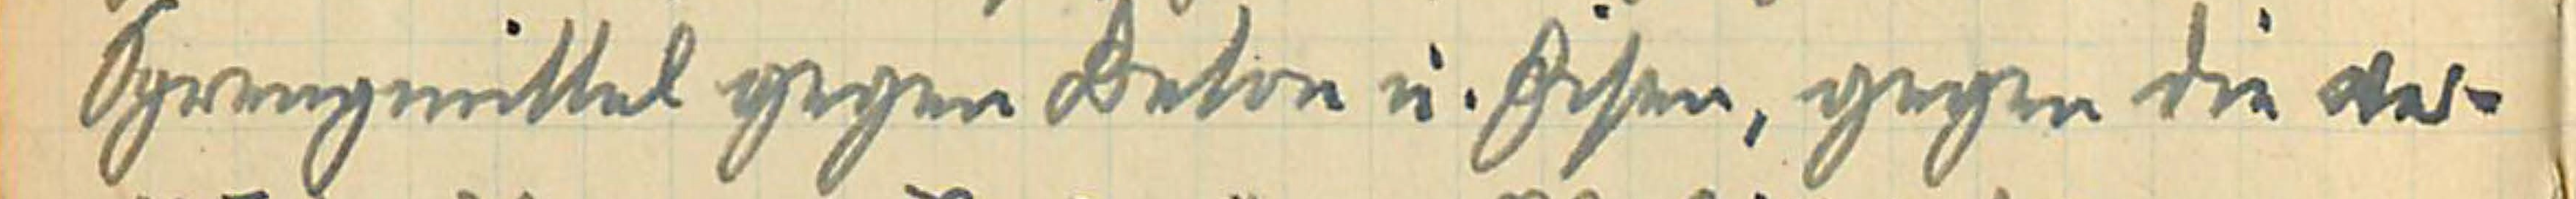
Sprengmitteln gegen Beton u. Eisen, gegen die ver-
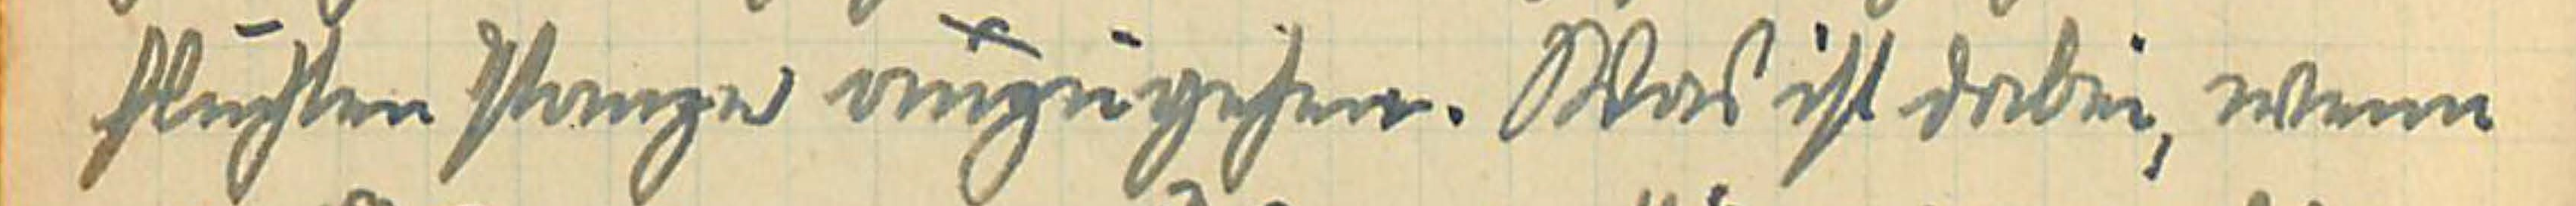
fluchten Panzer anzugehen. Was ist dabei, wenn
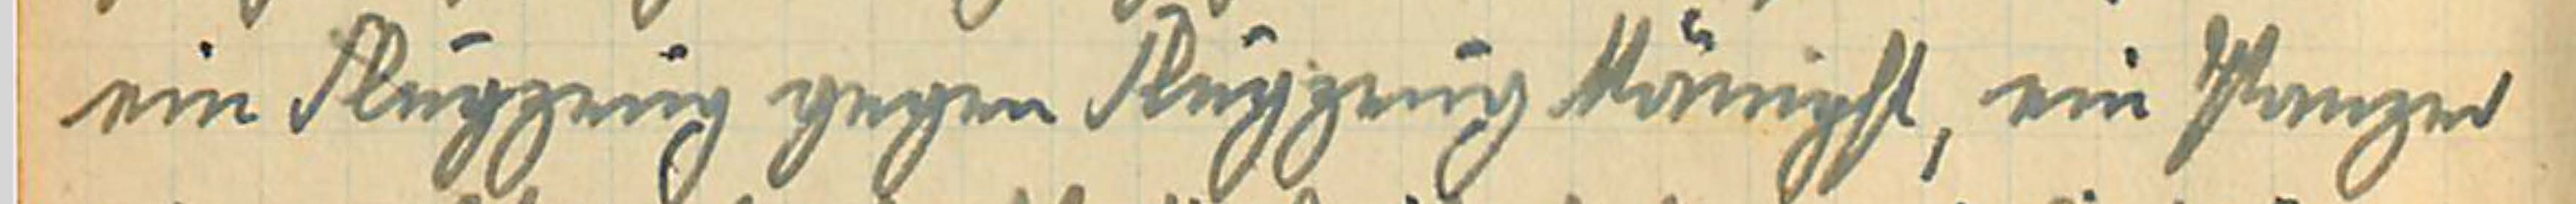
ein Flugzeug gegen Flugzeug kämpft, ein Panzer
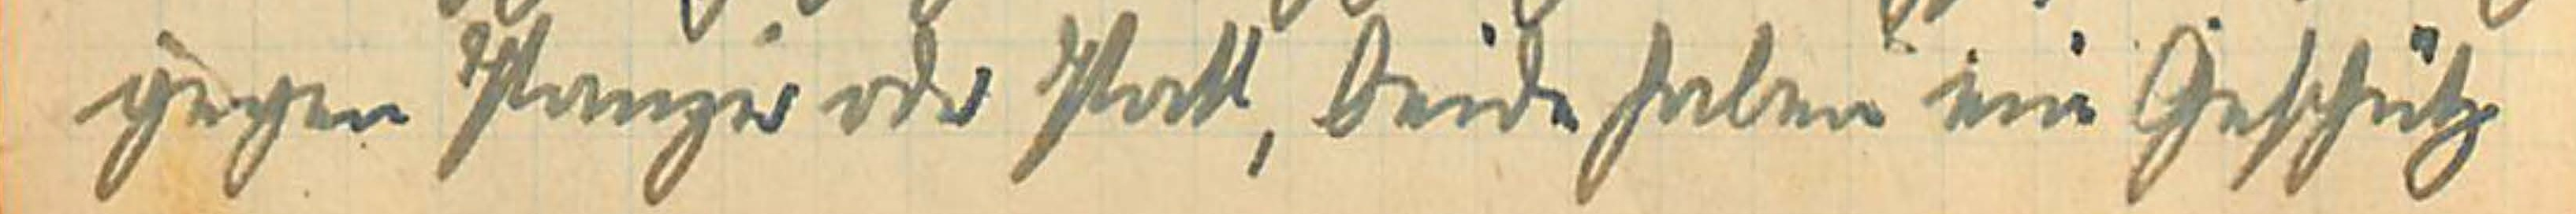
gegen Panzer oder Pak, beide haben ein Geschütz
